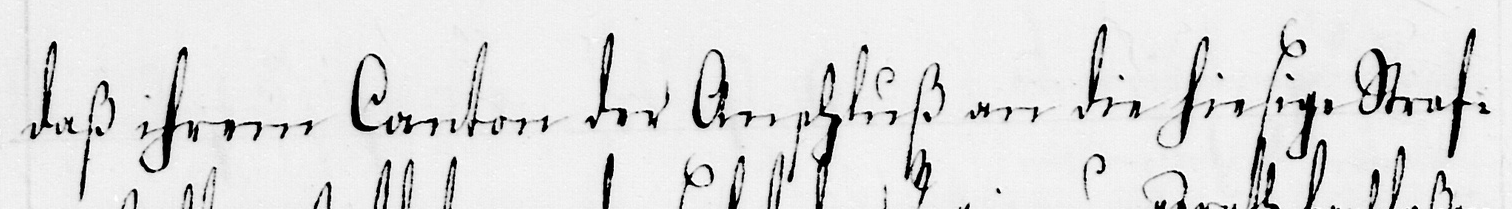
daß ihrem Canton der Anschluß an die hiesige Straf¬
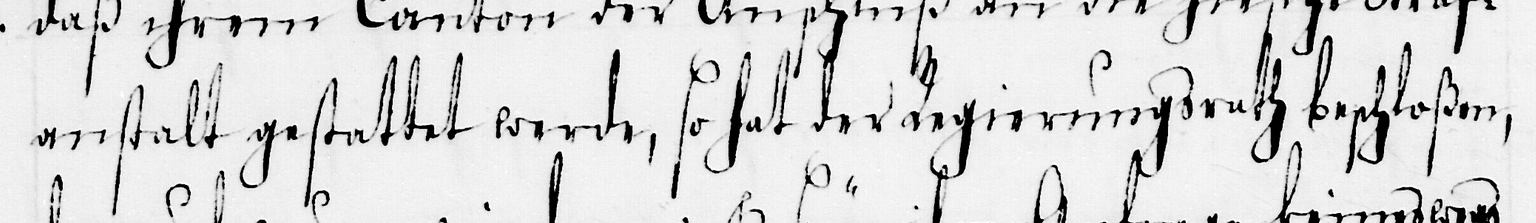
anstalt gestattet werde, so hat der Regierungsrath beschloßen,
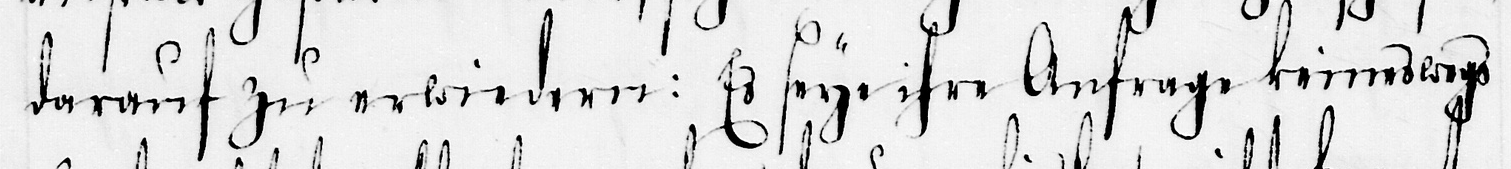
darauf zu erwiedern: Es seye ihre Anfrage keineswegs
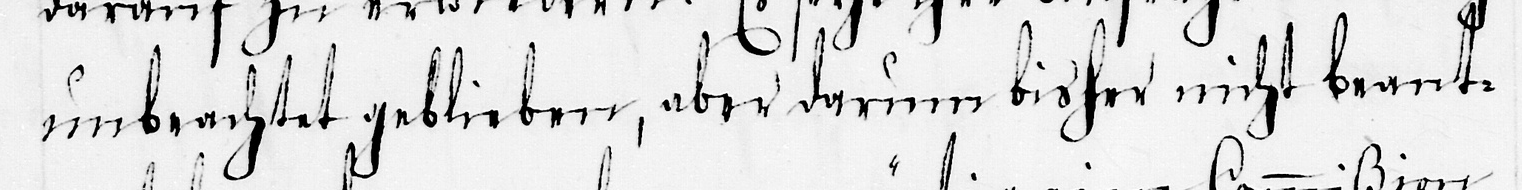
unbeachtet geblieben, aber darum bisher nicht beant¬
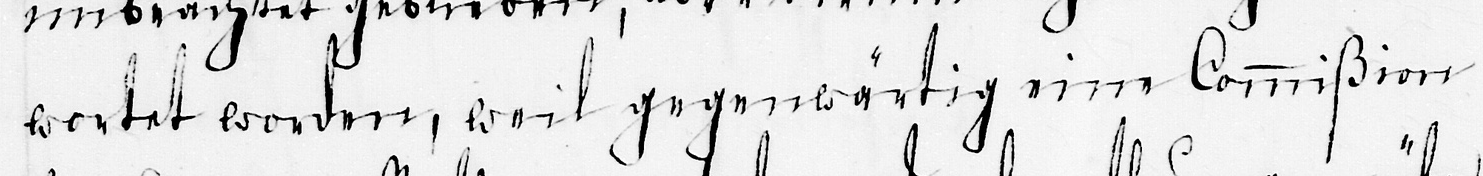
wortet worden, weil gegenwärtig eine Commißion
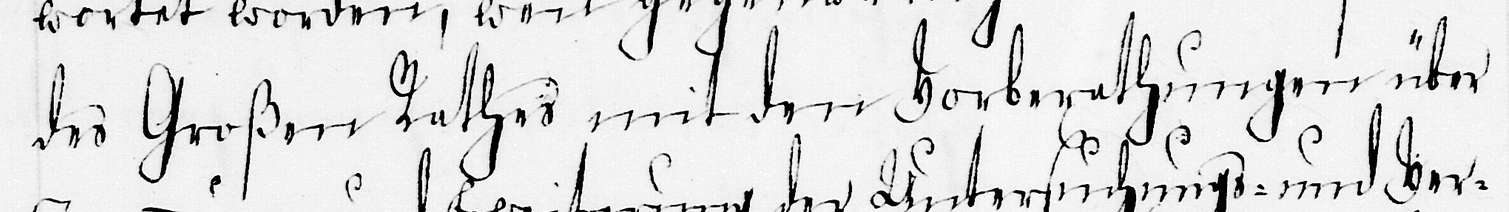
des Großen Rathes mit den Vorberathungen über
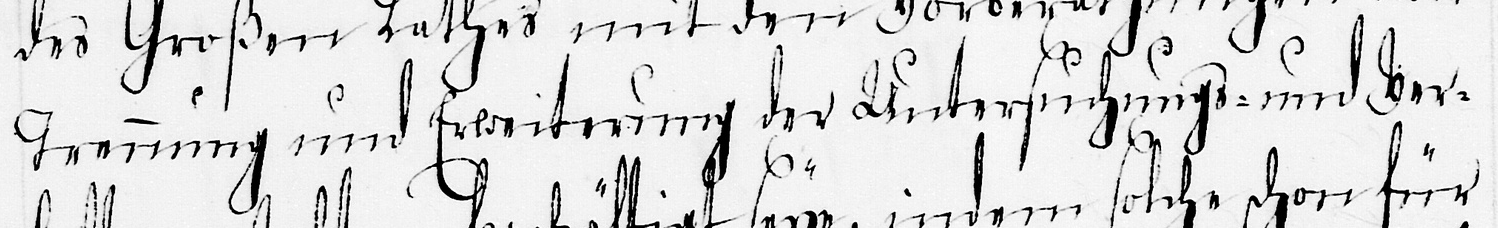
Trennung und Erweiterung der Untersuchungs- und Ver¬
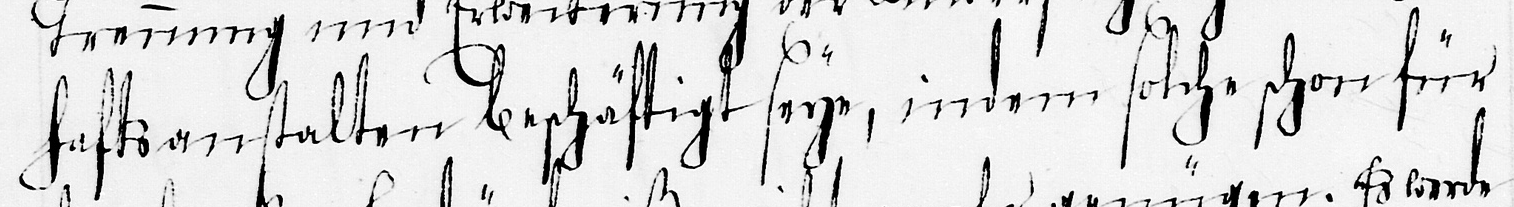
haftsanstalten beschäftigt seye, indem solche schon für
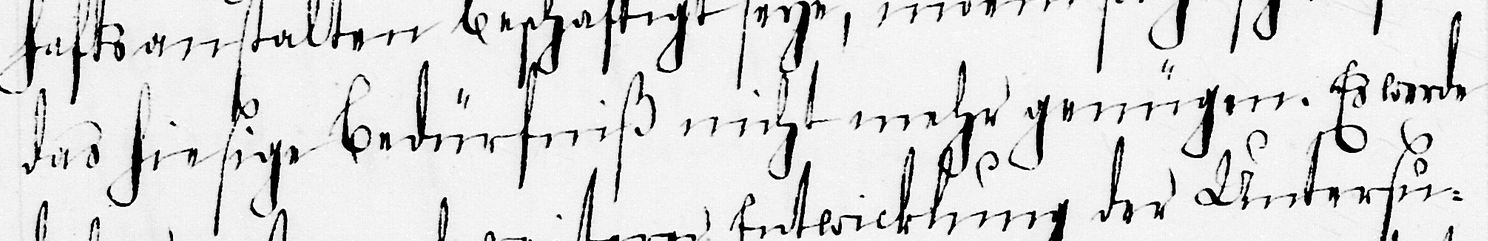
das hiesige Bedürfniß nicht mehr genügen. Es werde
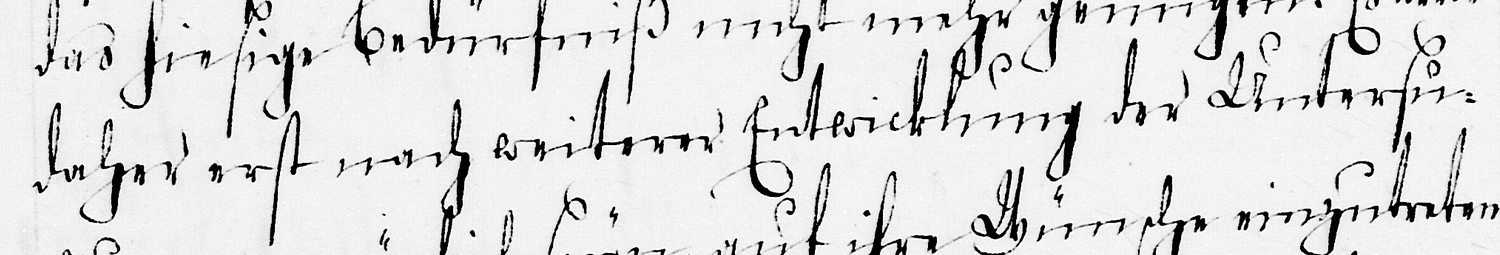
daher erst nach weiterer Entwicklung der Untersu¬
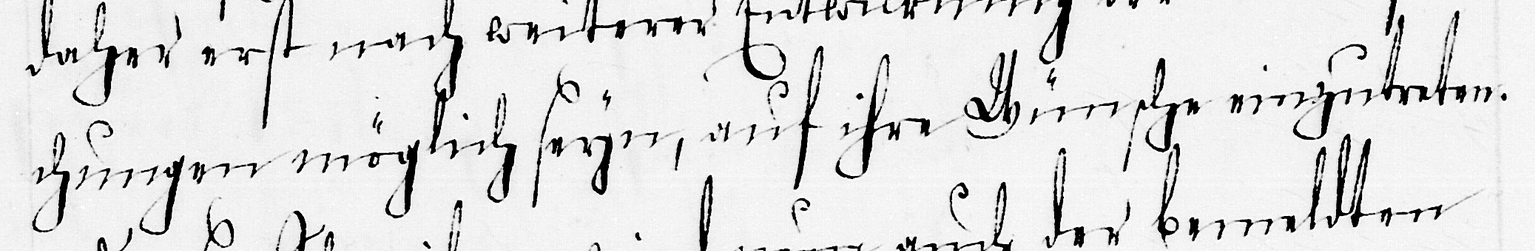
chungen möglich seyn, auf ihre Wünsche einzutreten.
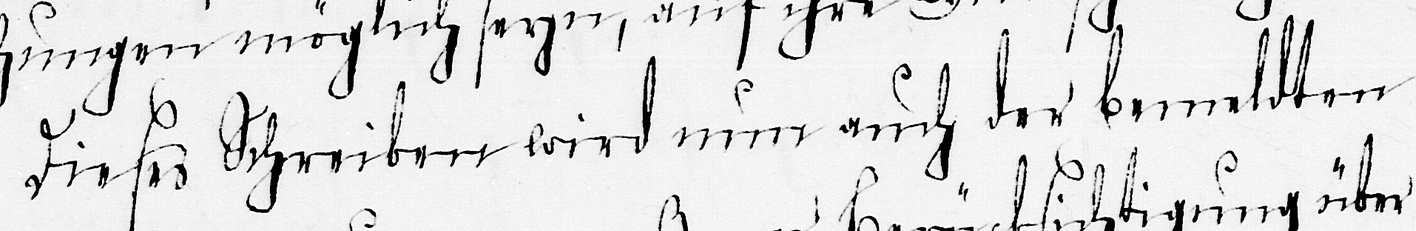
Dieses Schreiben wird nun auch der bemeldten
